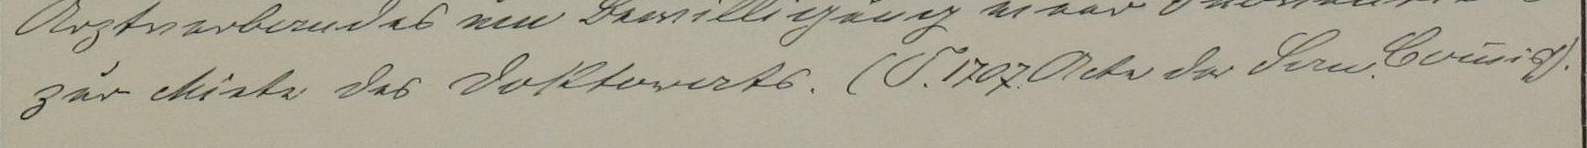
zur Miete des Doktorats. (T.1707. Acte der San. Commiss.).
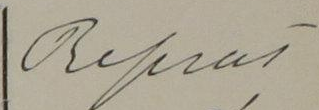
Referat
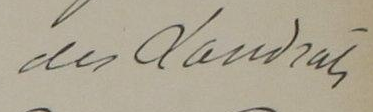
des Landrats
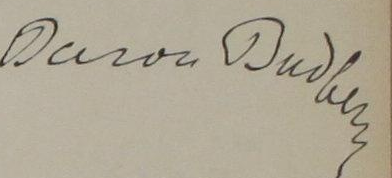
Baron Budberg
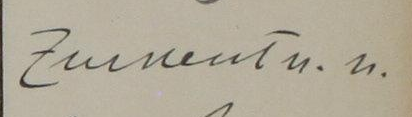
Zurkentn. n.
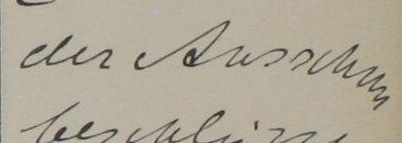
der Ausschuss
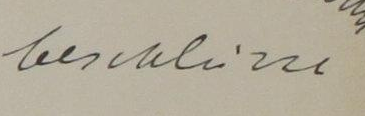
beschlüsse
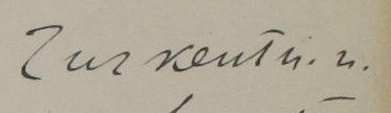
Zurkentn. n.
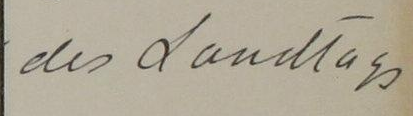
des landtags
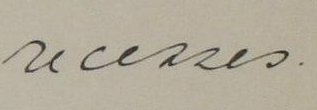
recesses
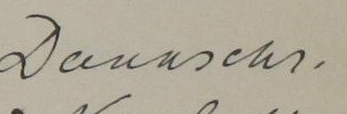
Dankschr.
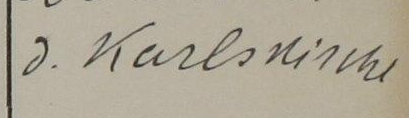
d. Karlskirche
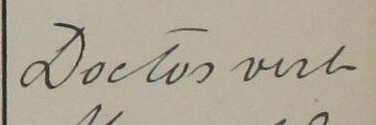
Doctorverb
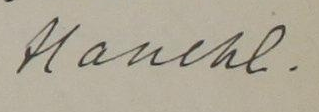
Hanehl
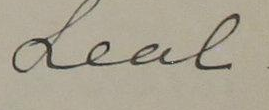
Leal
